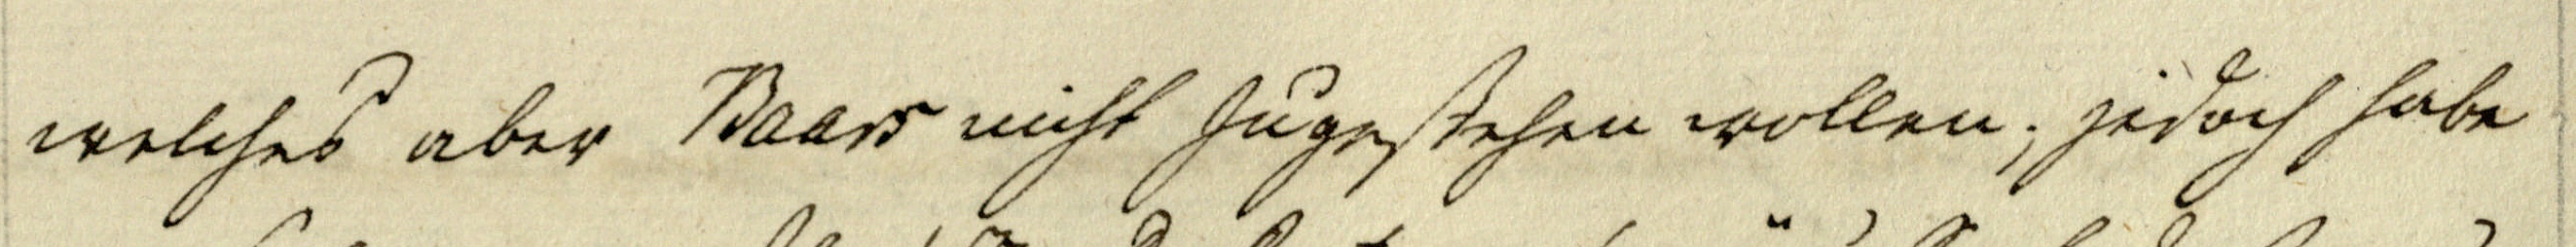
welches aber Baars nicht zugestehen wollen, jedoch habe
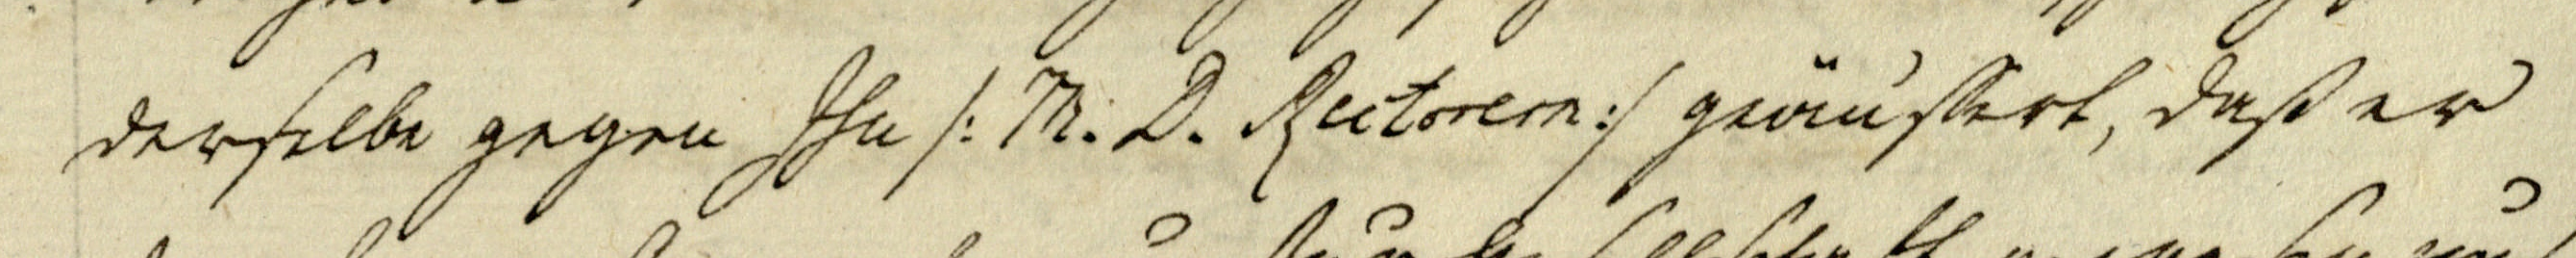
derselbe gegen Ihn /: M. D. Rectorem :/ geäussert, daß er
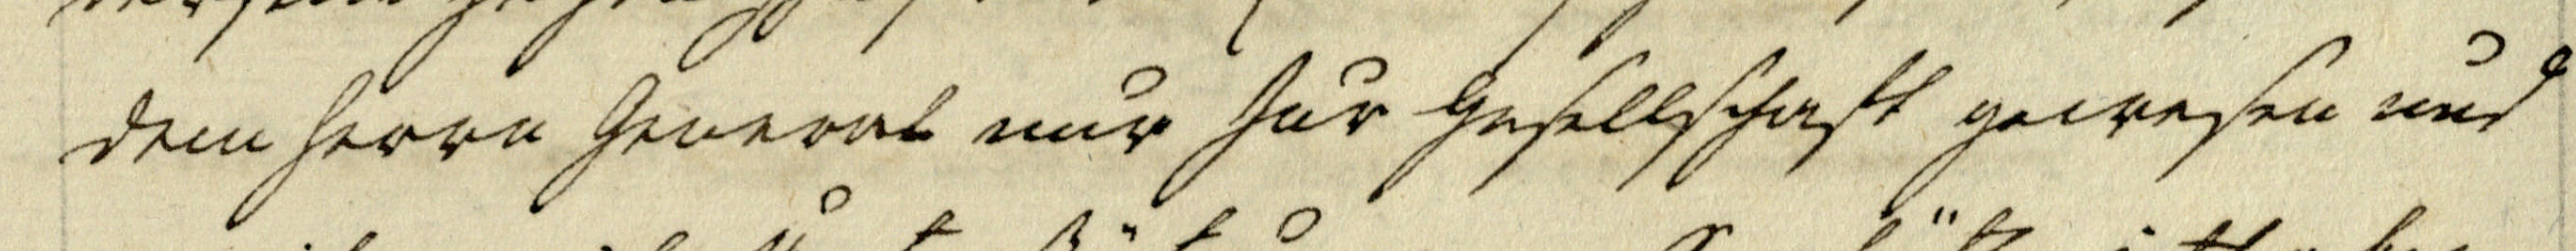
dem Herrn General nur zur Gesellschaft gewesen und
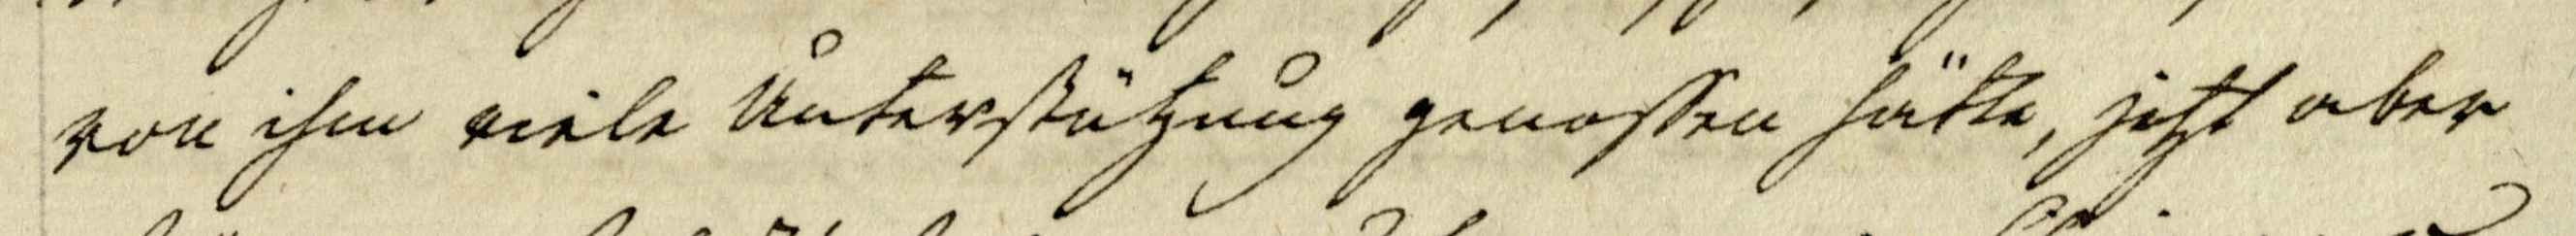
von ihm viele Unterstützung genossen hätte, jetzt aber
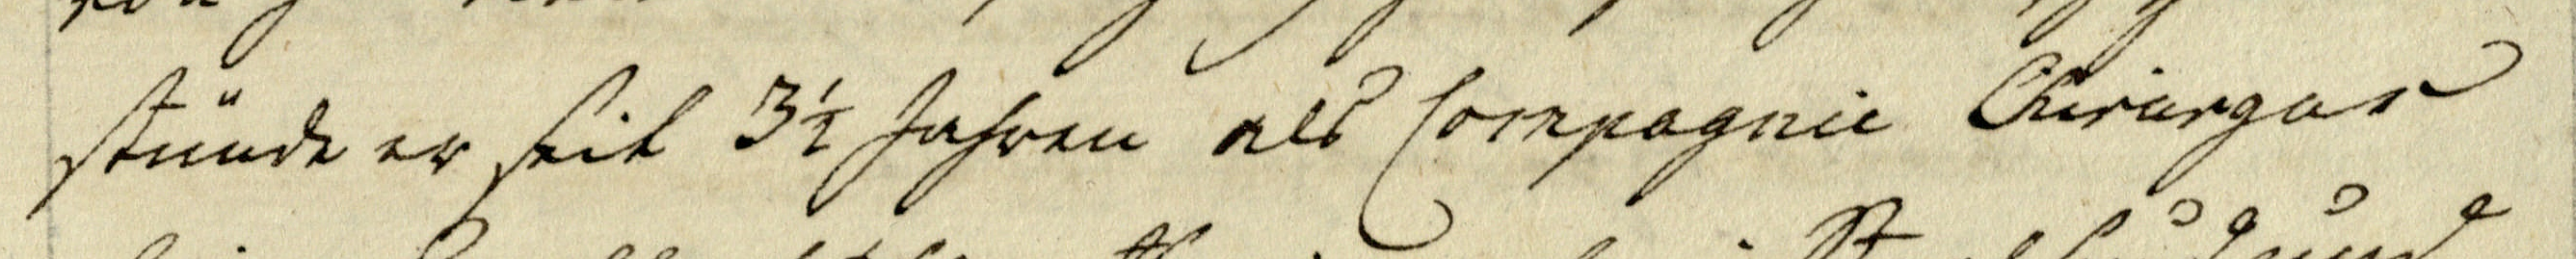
stünde er seit 3½ Jahren als Compagnie Chirurgus
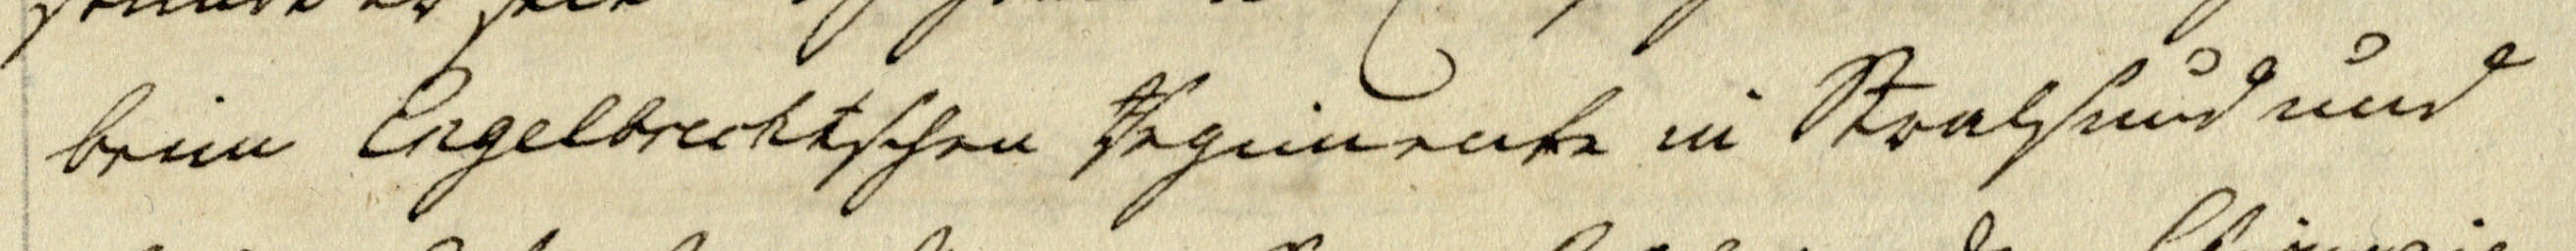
beim Engelbrechtschen Regimente in Stralsund und
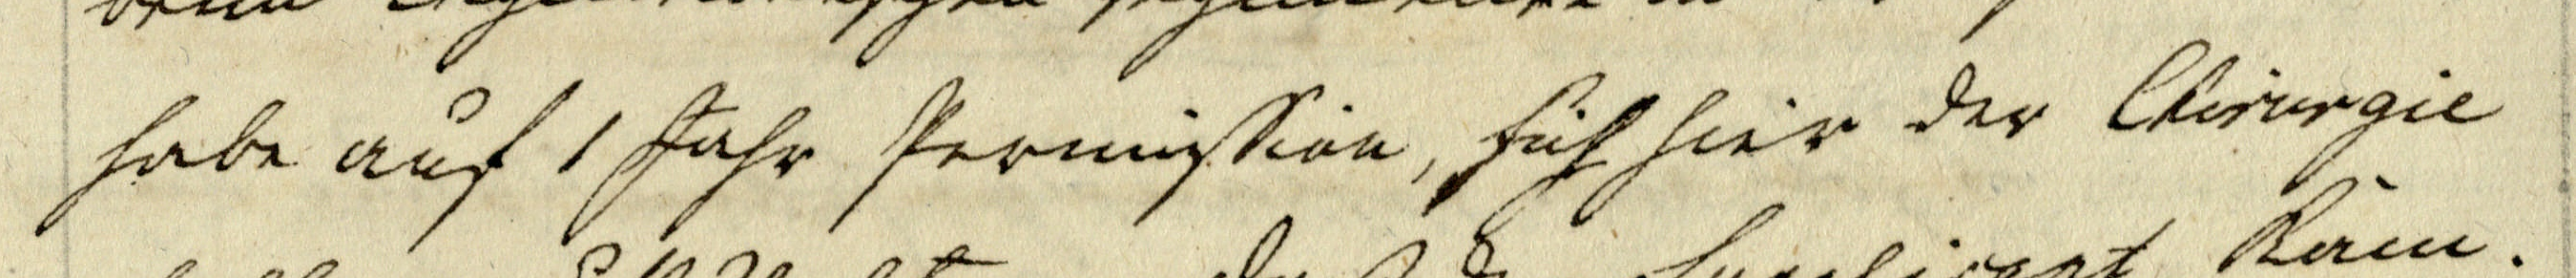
habe auf 1 Jahr Permission, sich hier der Chirurgie
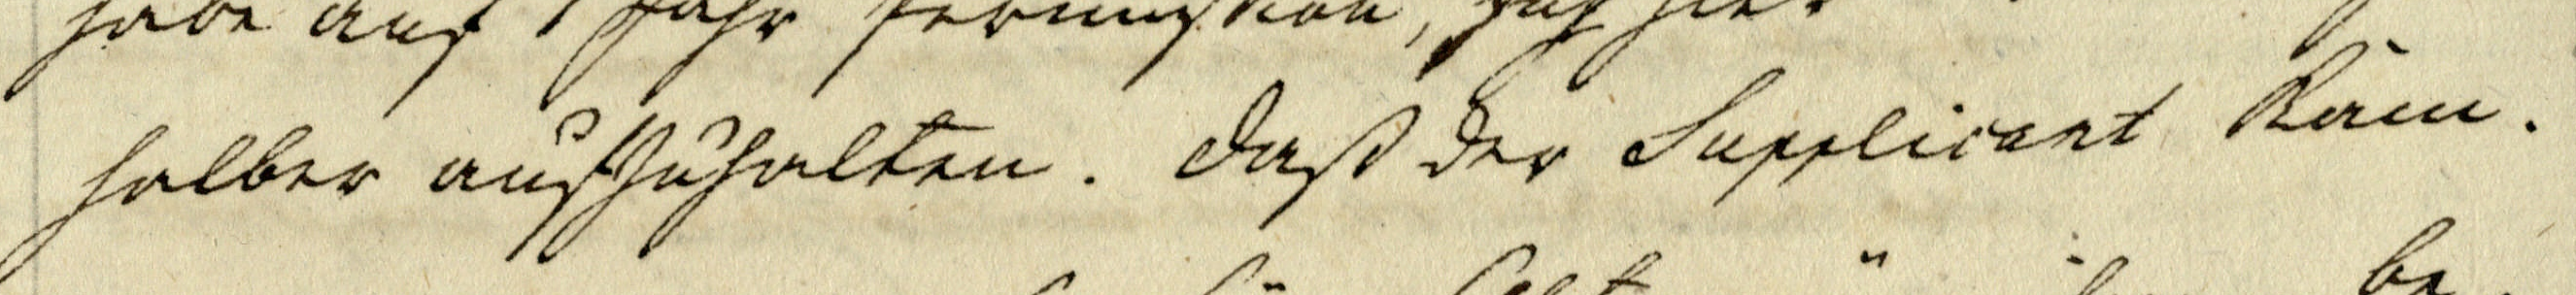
halber aufzuhalten. Daß der Supplicant Kam¬
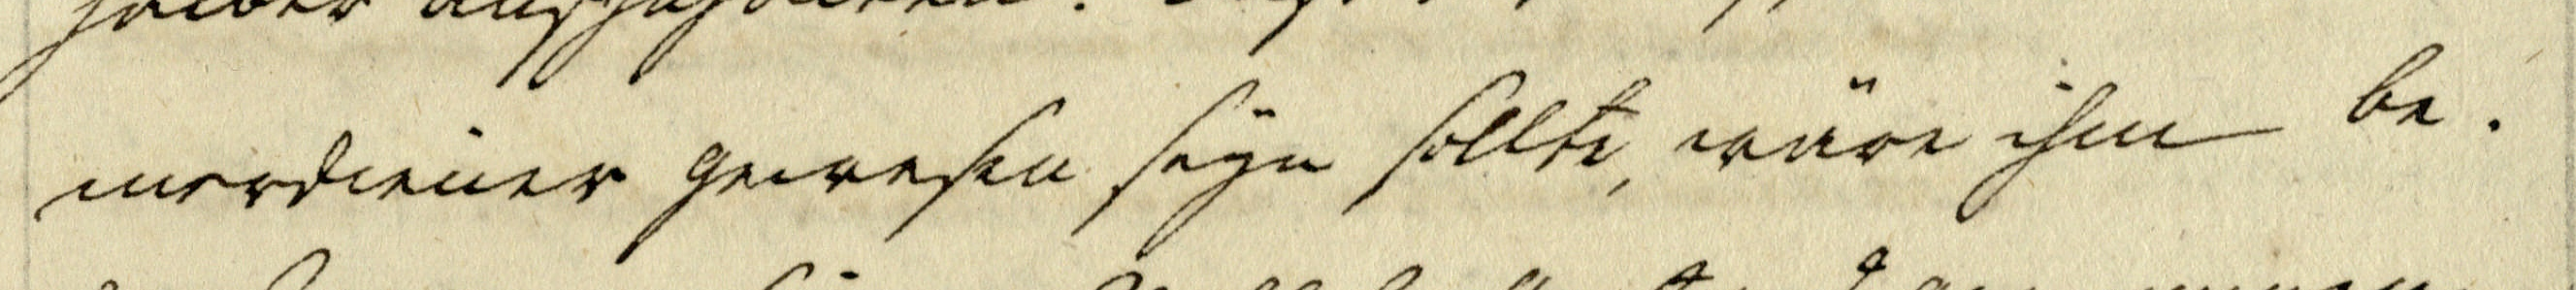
merdiener gewesen seÿn sollte, wäre ihm be¬
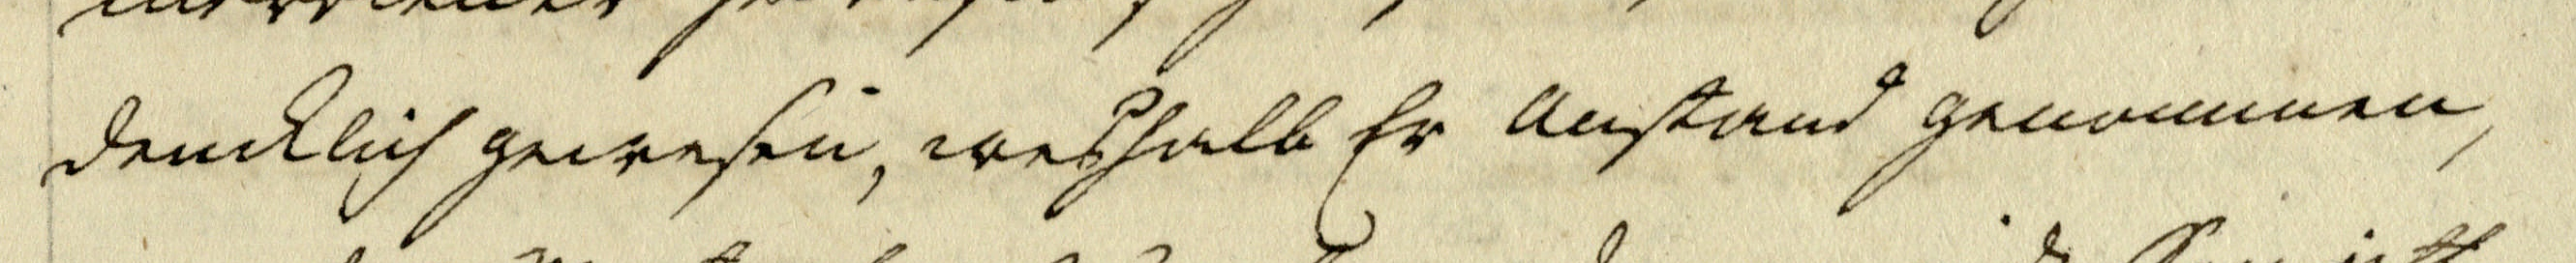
dencklich gewesen, weshalb Er Anstand genommen,
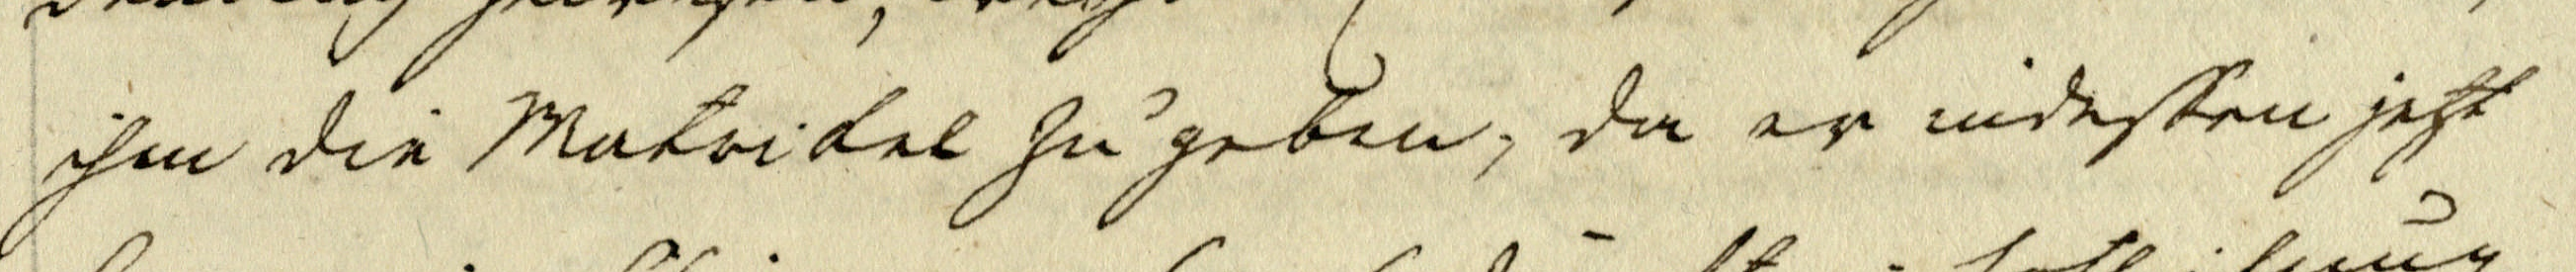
ihm die Matrikel zu geben, da er indessen jetzt
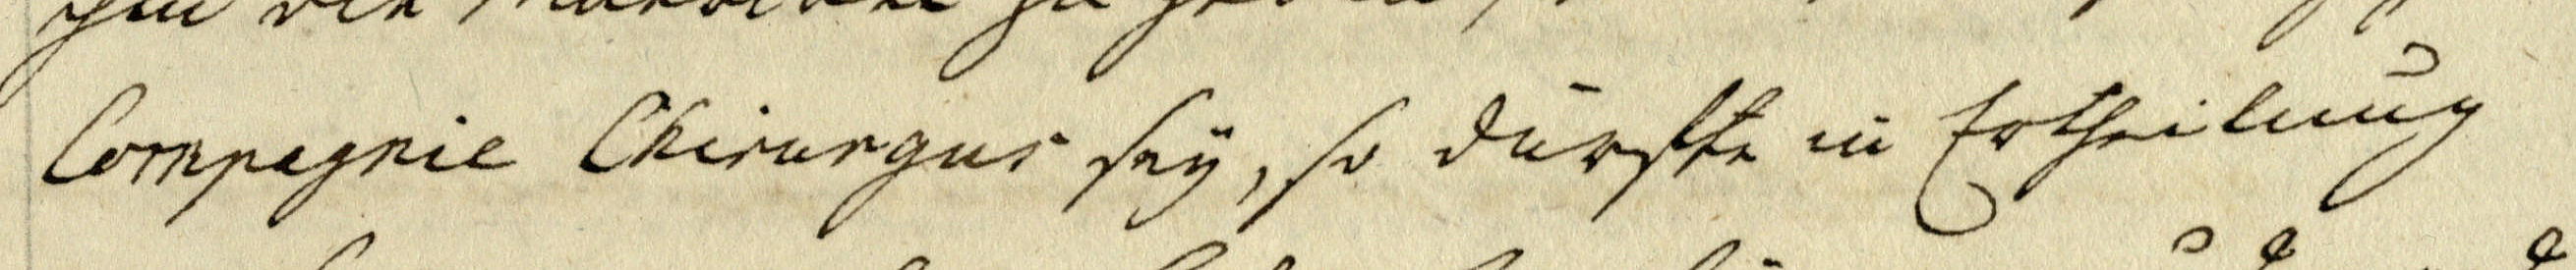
Compagnie Chirurgus seÿ, so dürfte in Ertheilung
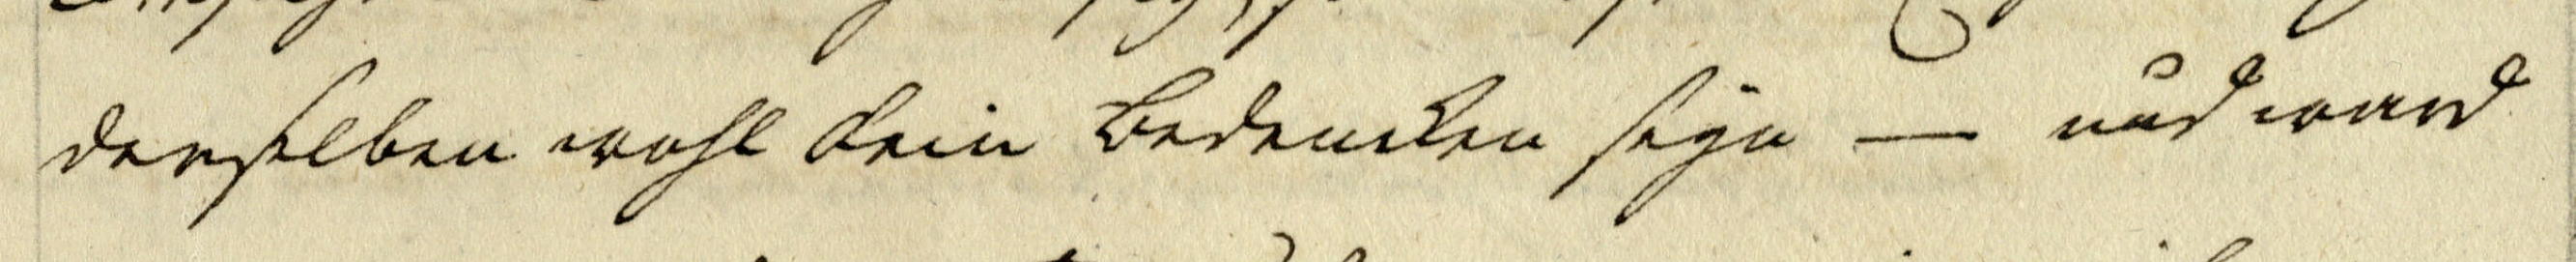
derselben wohl kein Bedencken seÿn und ward
